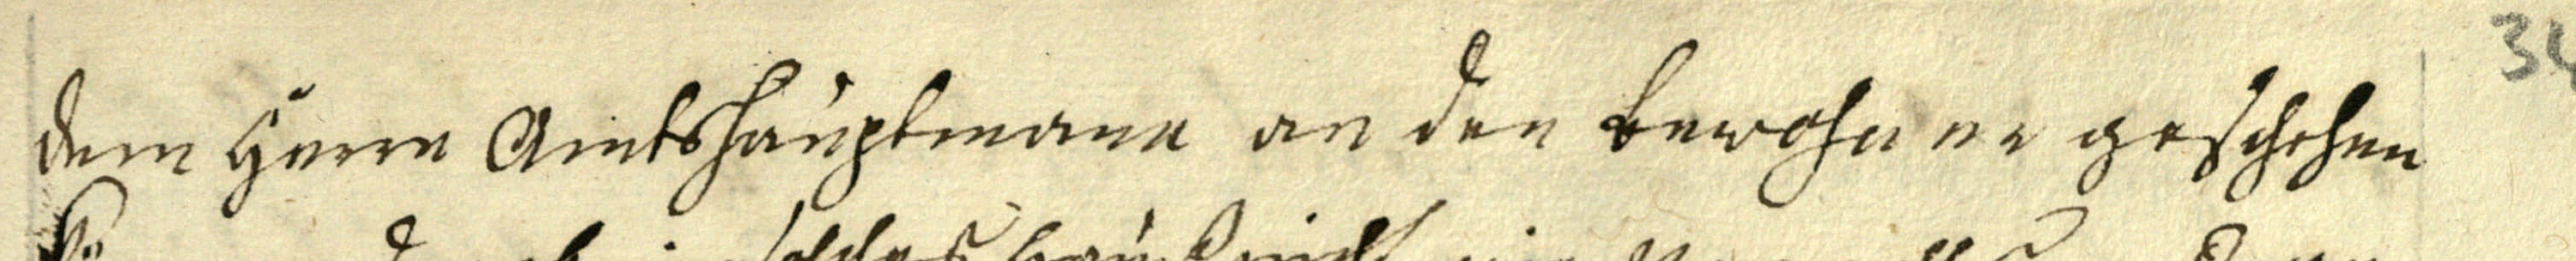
dem Herrn Amtshauptmann an den Bewohner geschehen
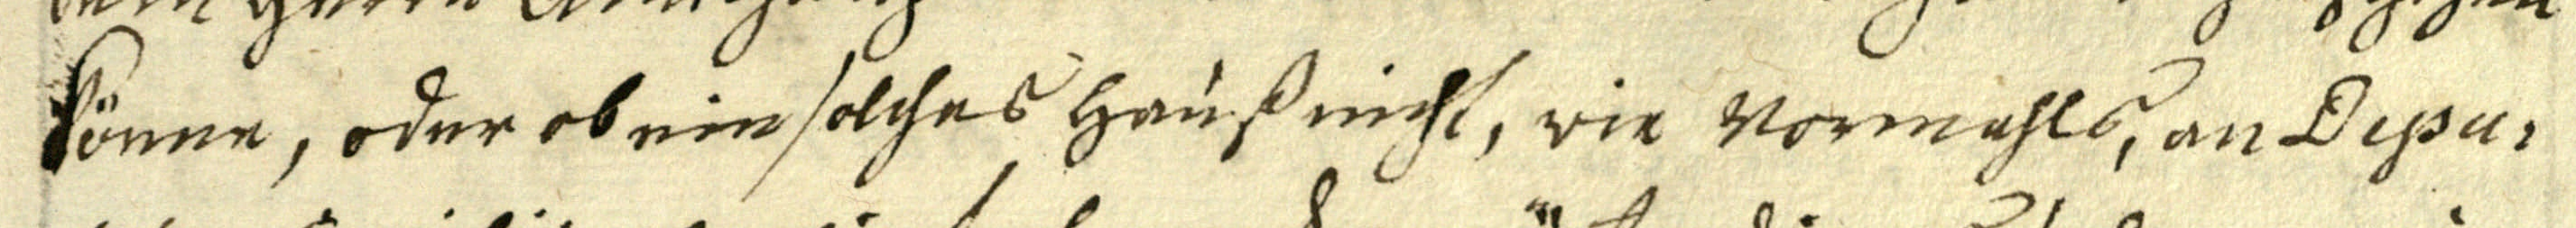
könne, oder ob ein solches Hauß nicht, wie vormahls, an Depu¬
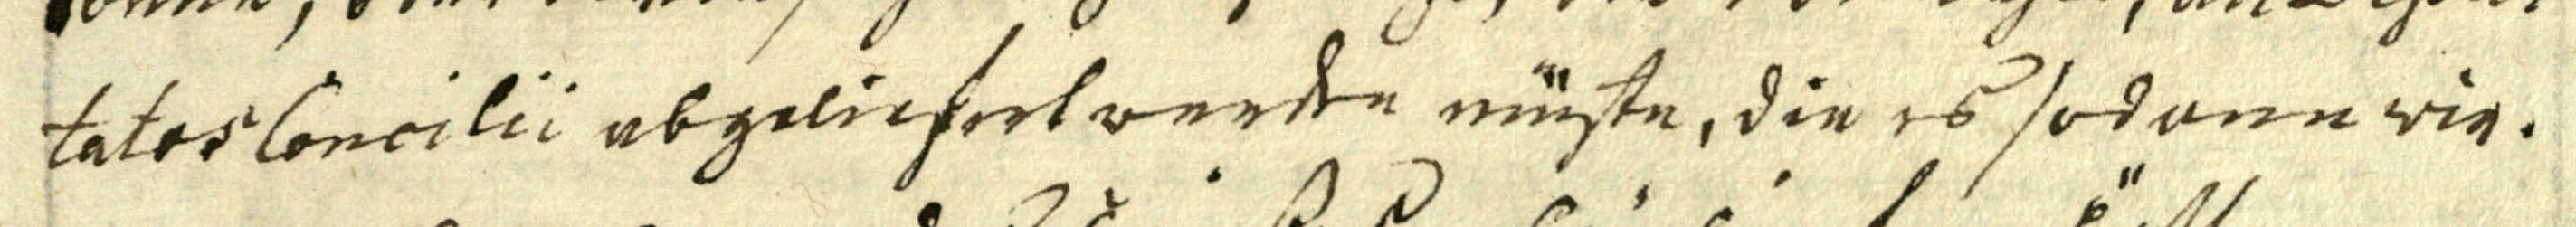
tatos Concilii abgeliefert werden müste, die es sodann wie¬
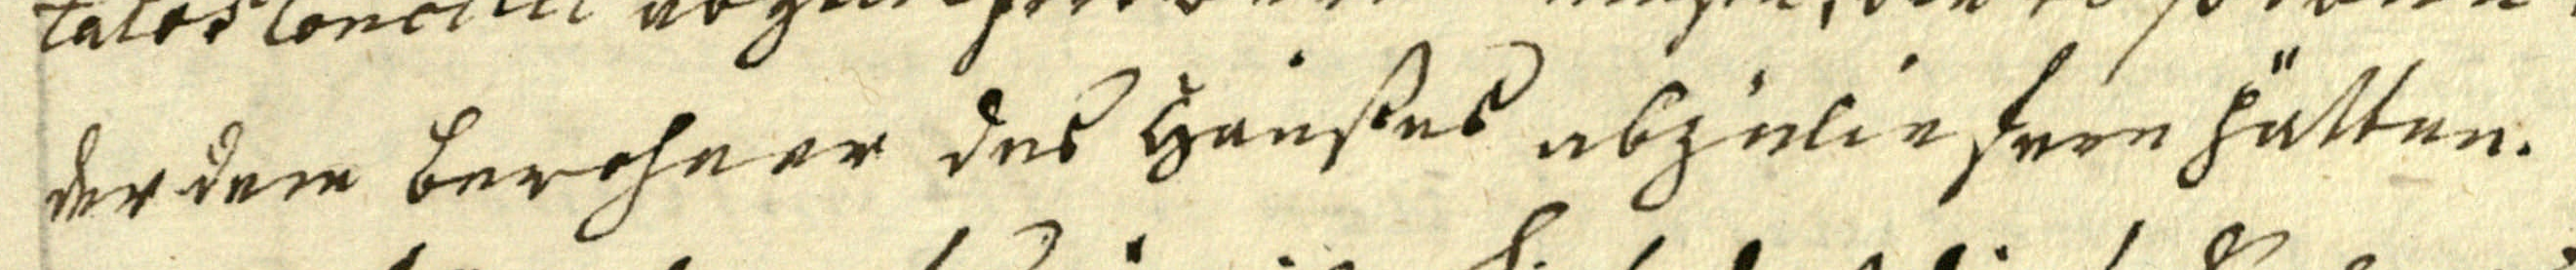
der dem Bewohner des Haußes abzuliefern hätten.
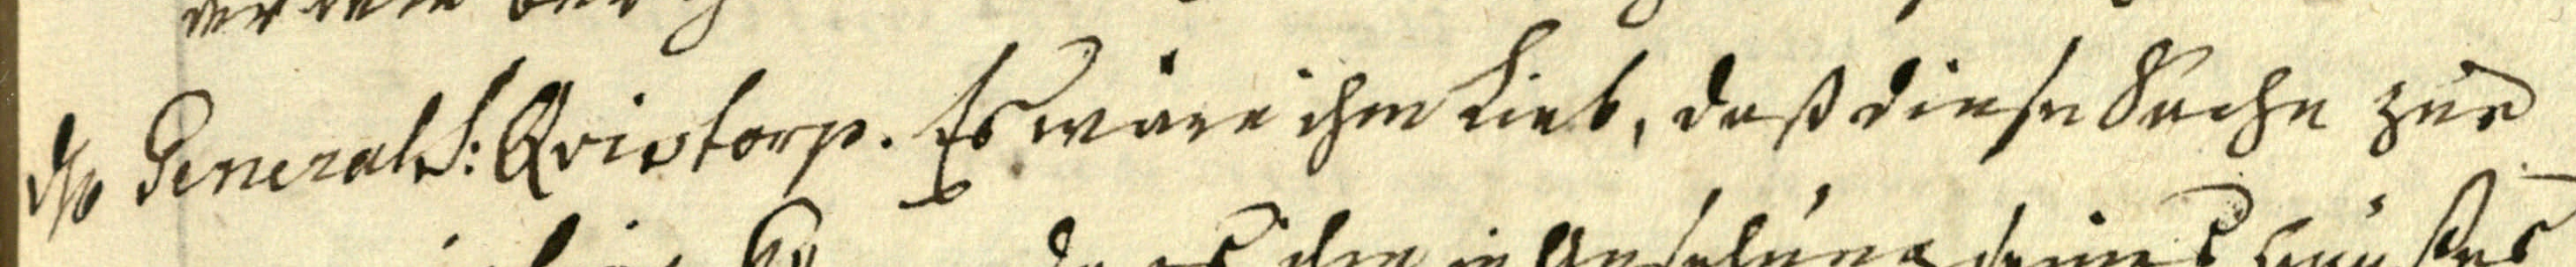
dh GeneralS. Quistorp. Es wäre ihm Lieb, daß diese Sache zur
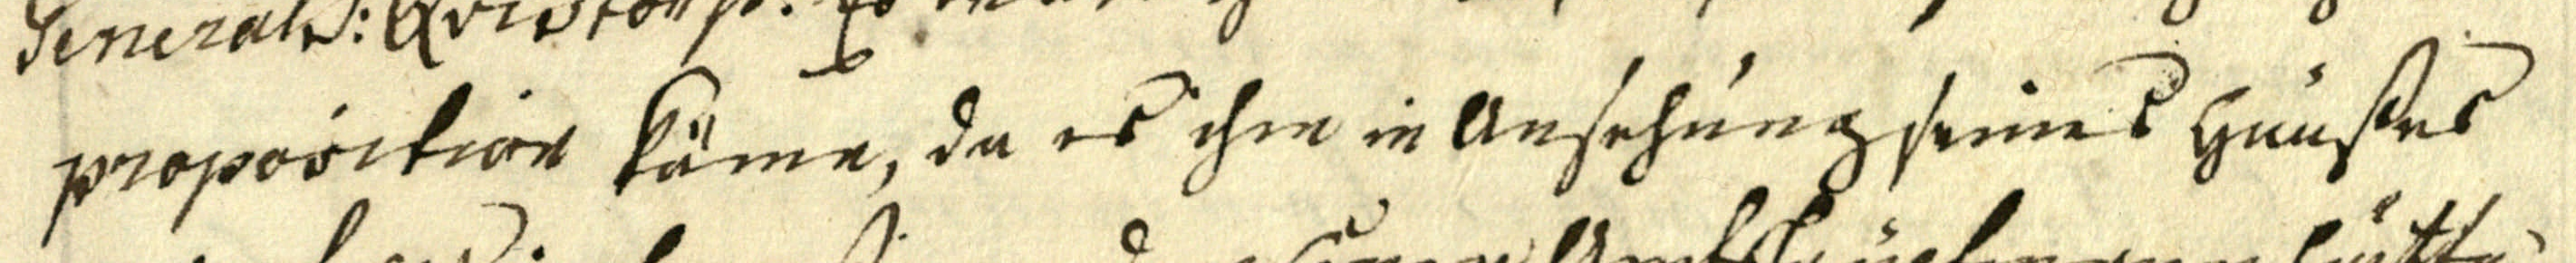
proposition käme, da es ihm in Ansehung seines Haußes
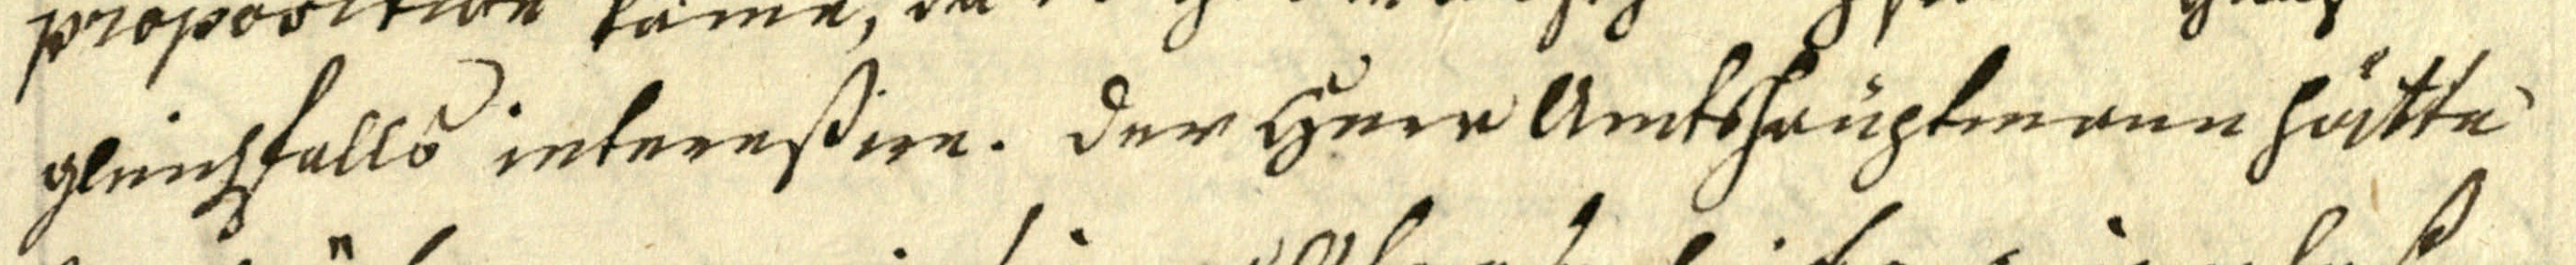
gleichfalls intereßire. Der Herr Amtshauptmann hätte
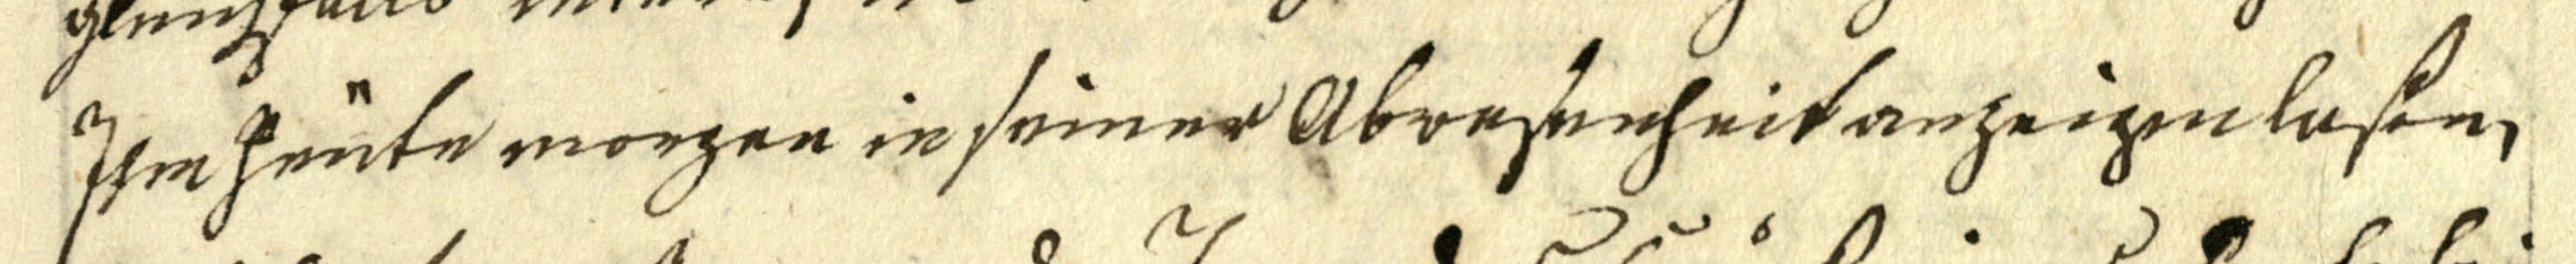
Ihm heute morgen in seiner Abwesenheit anzeigen laßen,
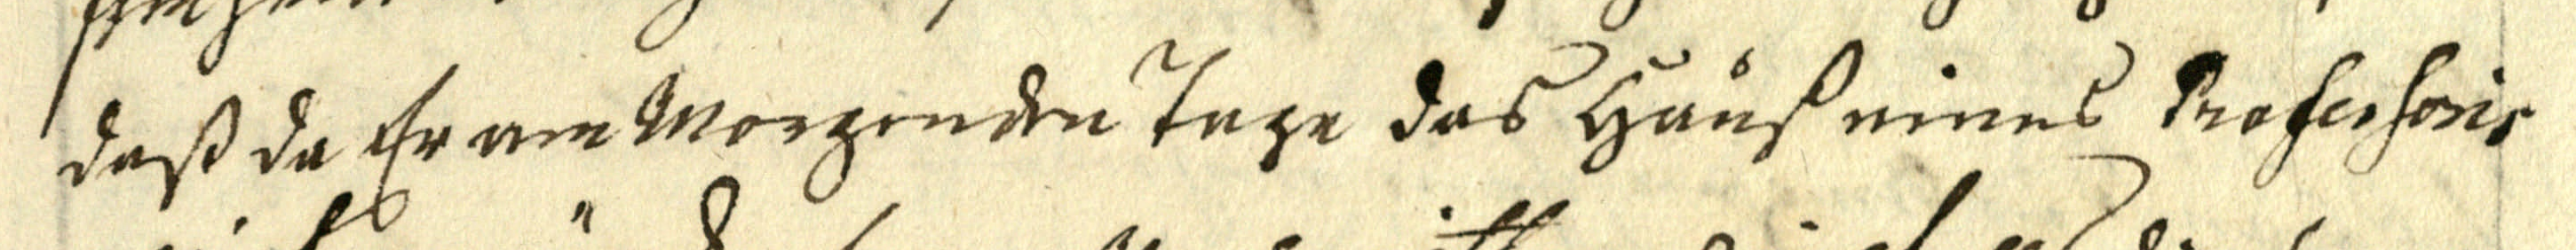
daß da Er am Morgenden Tage das Hauß eines Professoris
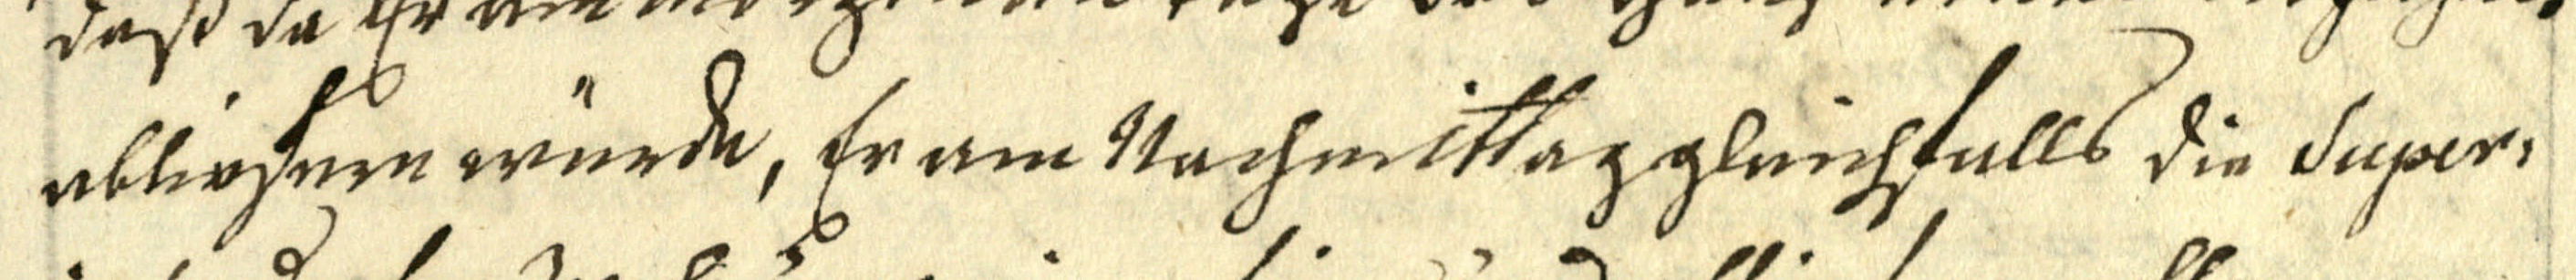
abliefern würde, Er am Nachmittag gleichfalls die Super¬
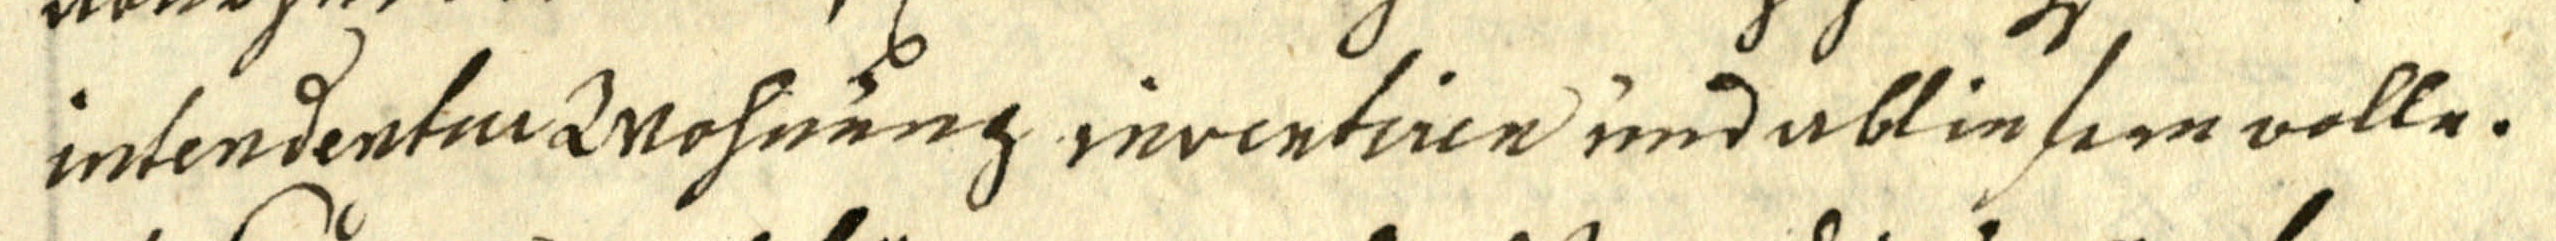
intendentur Wohnung inventiren und abliefern wolle.
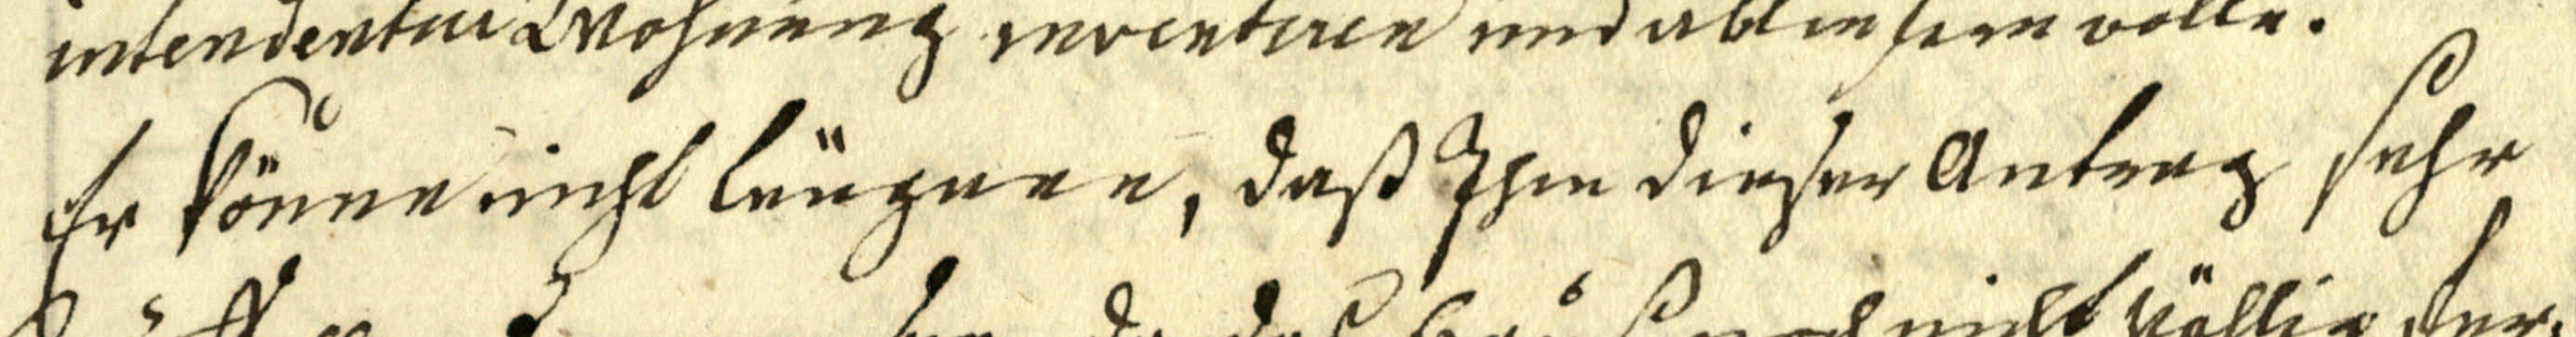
Er könne nicht leugnen, daß Ihm dieser Antrag sehr
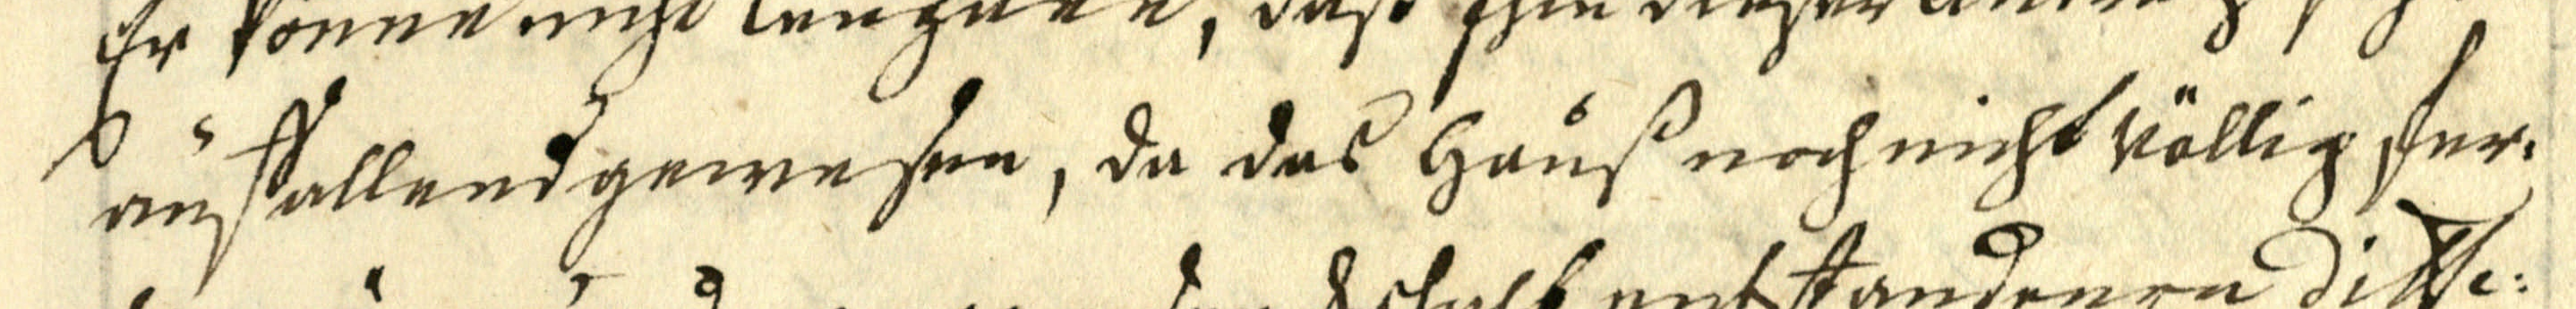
auffallend gewesen, da das Hauß noch nicht völlig fer¬
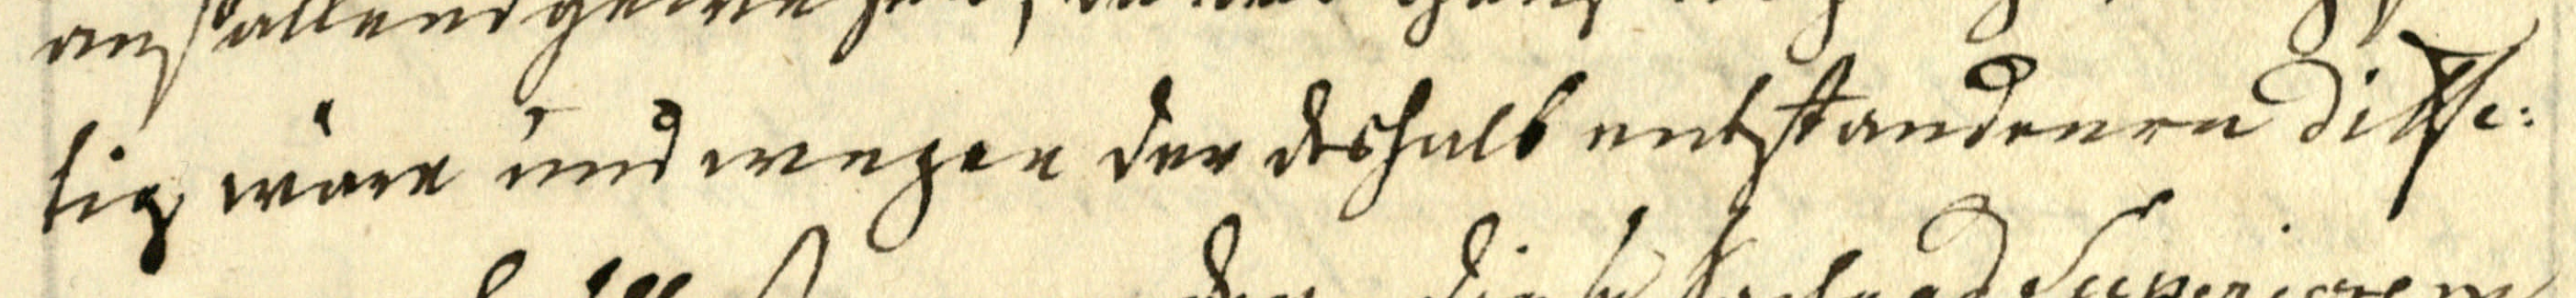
tig wäre und wegen der deshalb entstandenen diffe¬
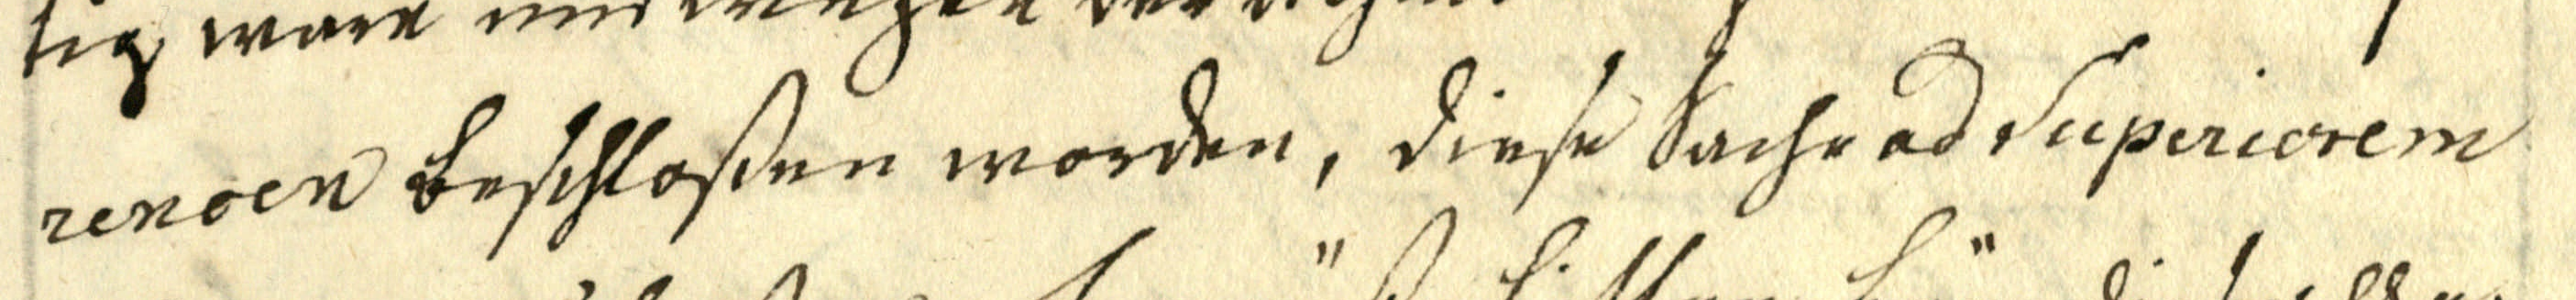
rencen beschloßen worden, diese Sache ad Superiorem
